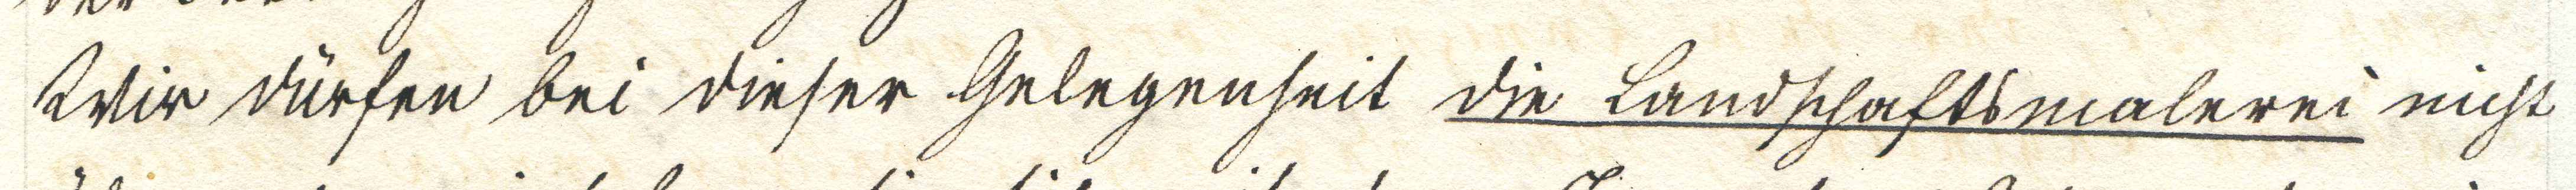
Wir dürfen bei dieser Gelegenheit die Landschaftsmalerei nicht
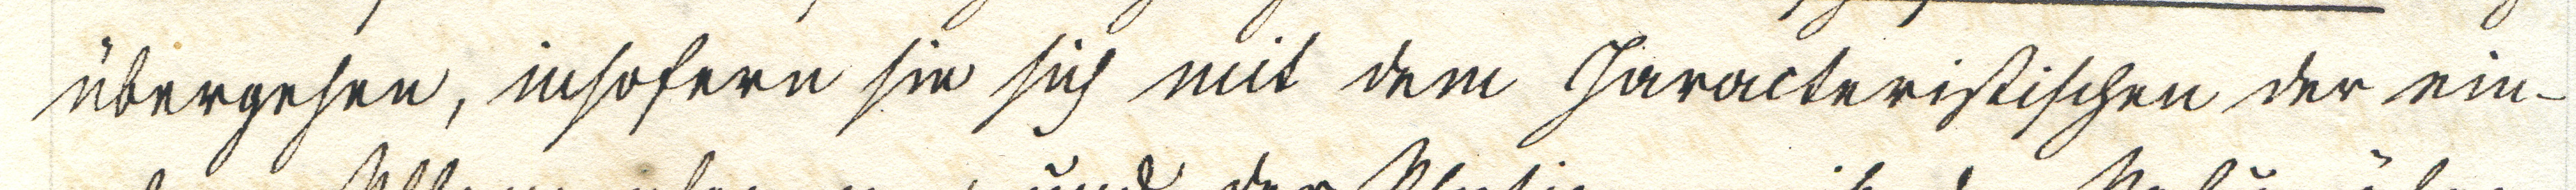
übergehen, insofern sie sich mit dem Characteristischen der ein-
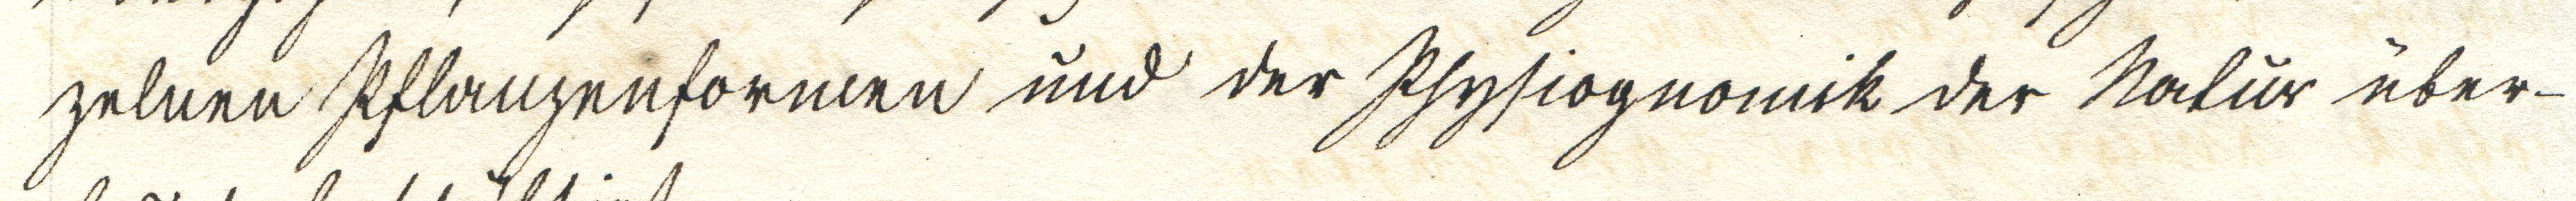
zelnen Pflanzenformen und der Physiognomik der Natur über-
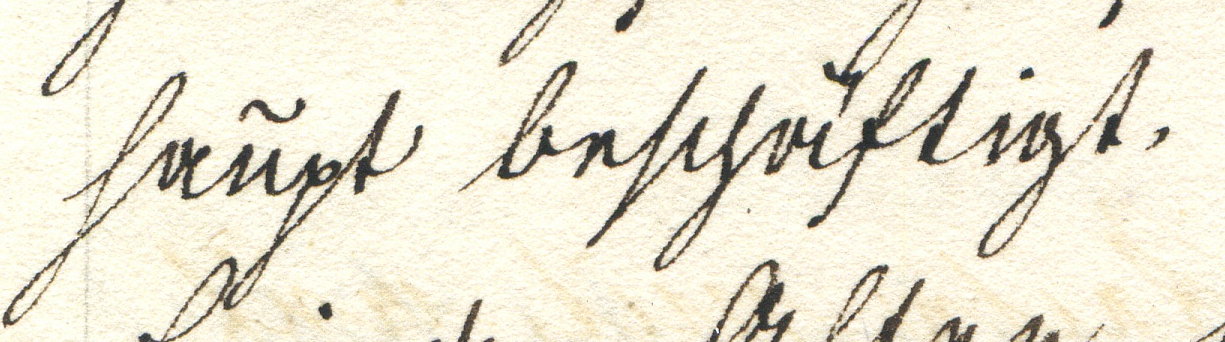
haupt beschäftigt.
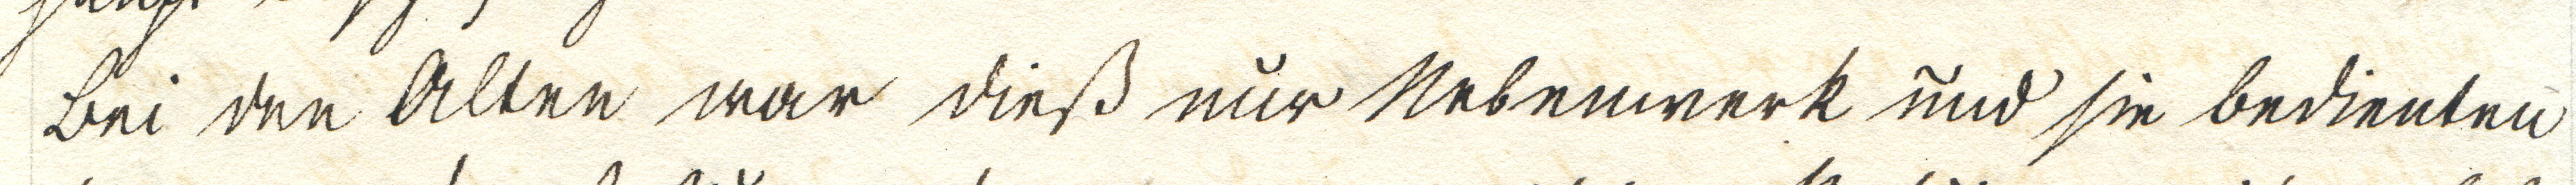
Bei den Alten war dieß nur Nebenwerk und sie bedienten
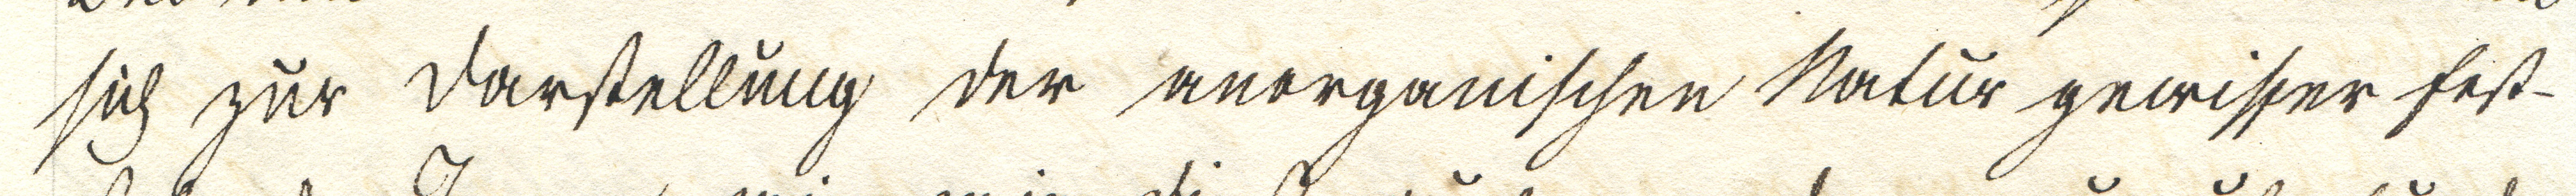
sich zur Darstellung der anorganischen Natur gewisser fest-
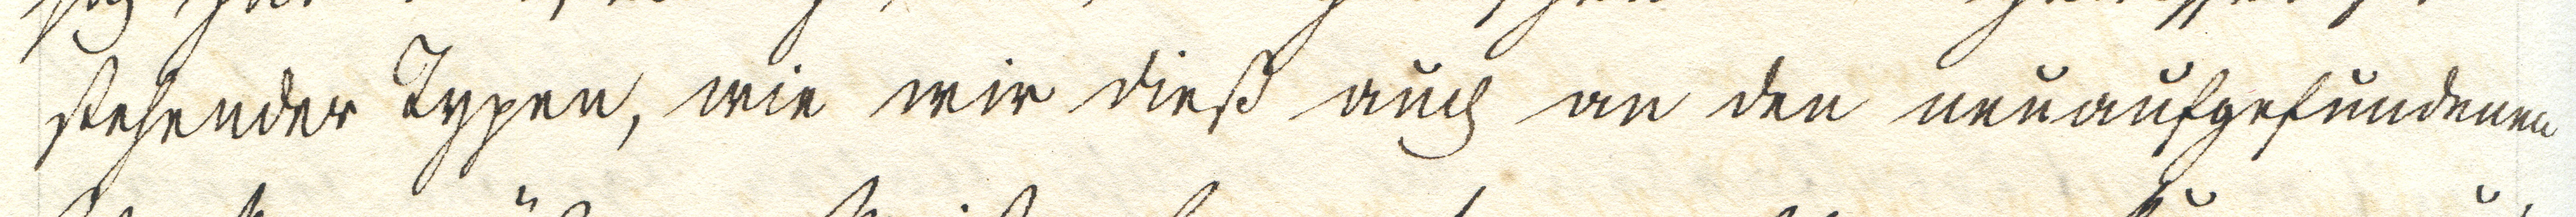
stehender Typen, wie wir dieß auch an den neuaufgefundenen
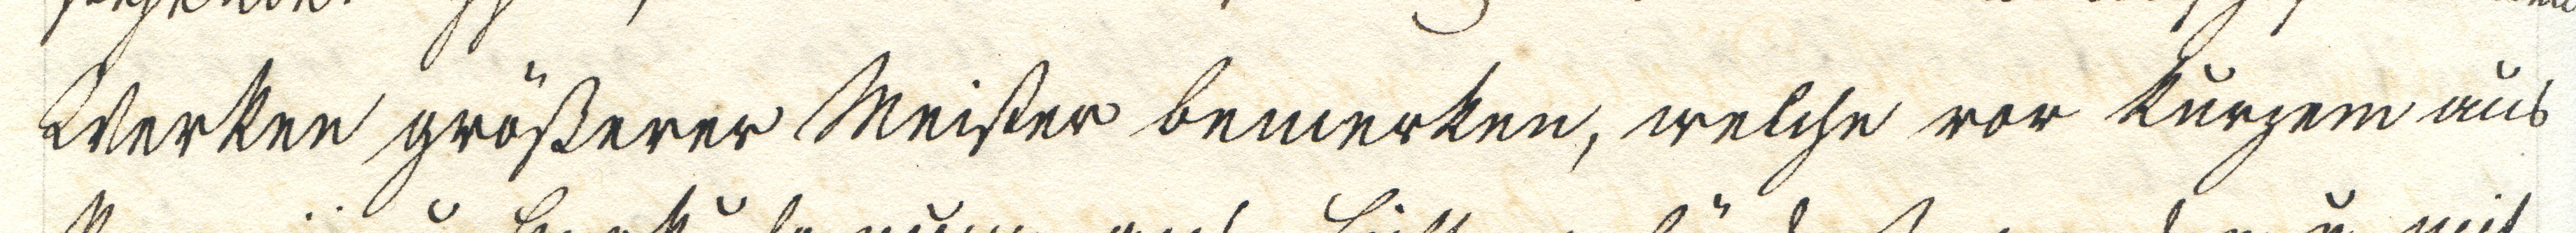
Werken größerer Meister bemerken, welche vor kurzem aus
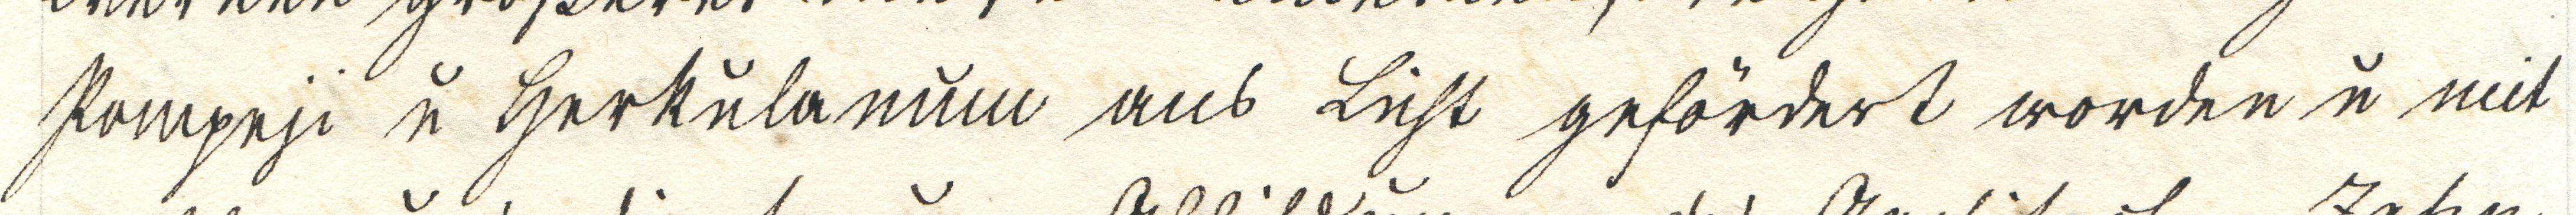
Pompeji u Herkulanum ans Licht gefördert worden u mit
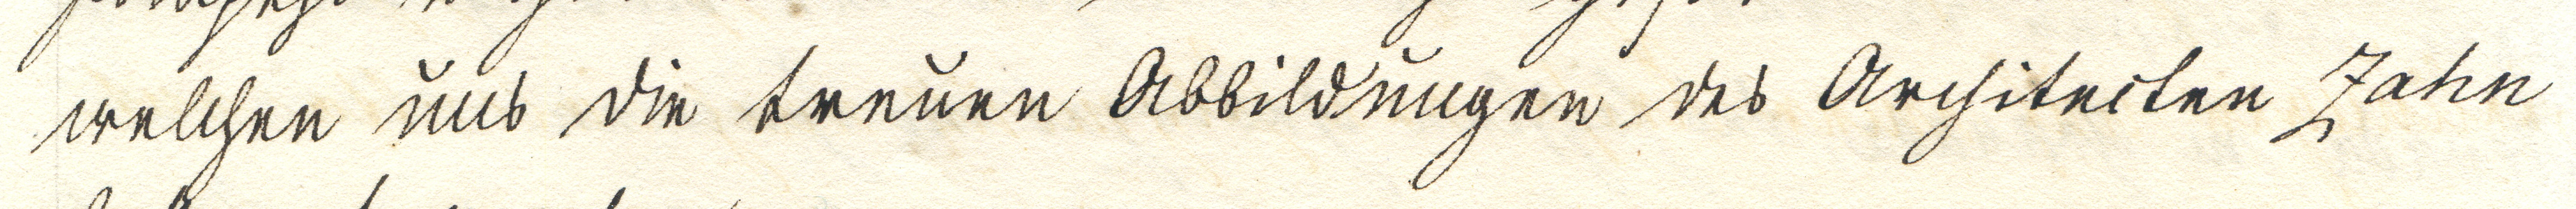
welchen uns die treuen Abbildungen des Architecten Zahn
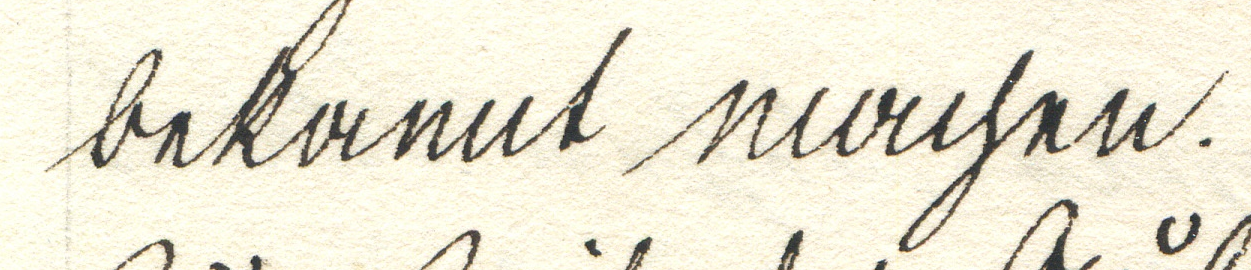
bekannt machen.
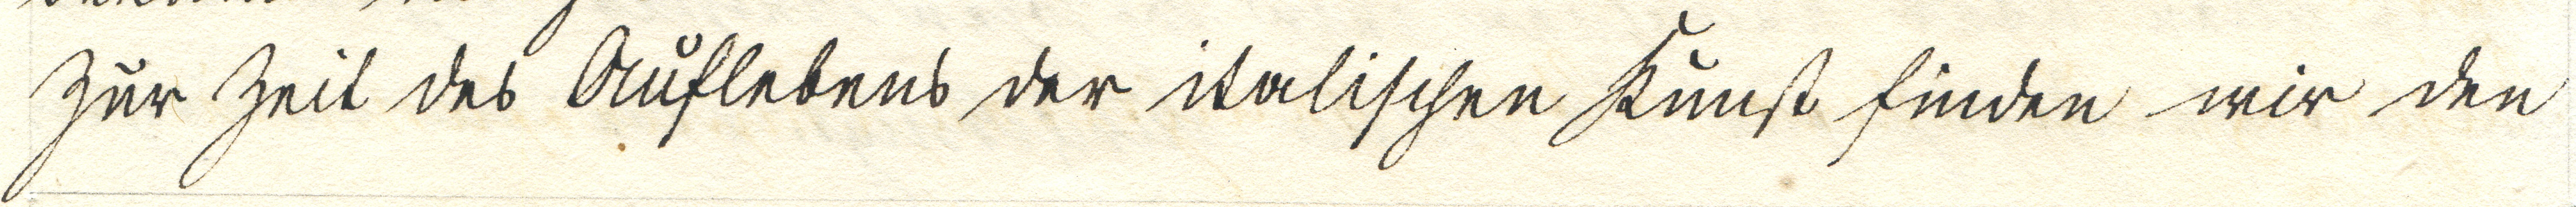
Zur Zeit des Auflebens der italischen Kunst finden wir den
